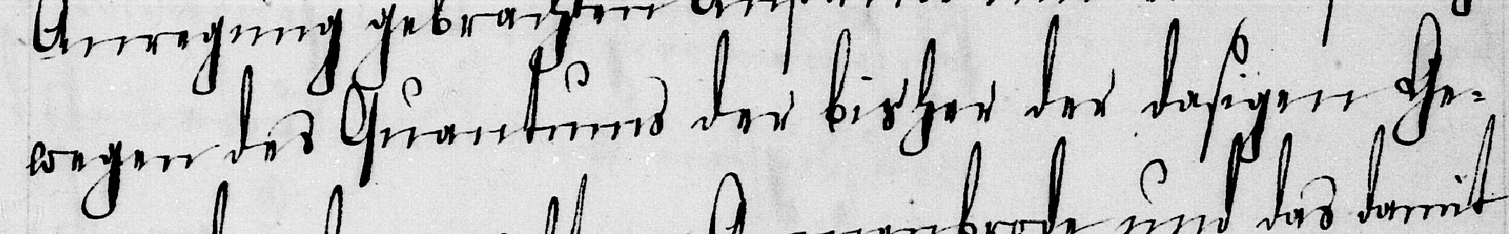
wegen des Quantums der bisher der dasigen Ge¬
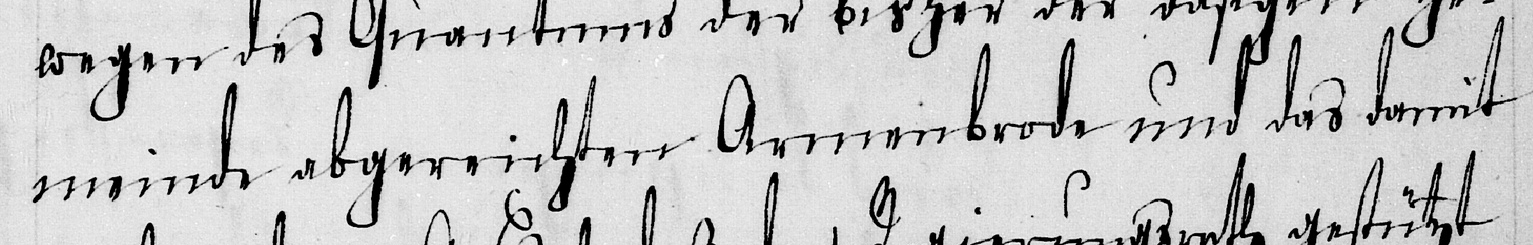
meinde abgereichten Armenbrode und das damit
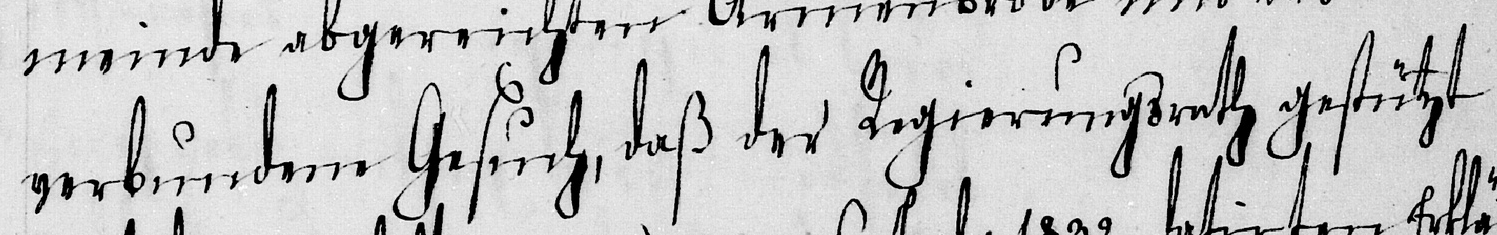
verbundene Gesuch, daß der Regierungsrath gestützt
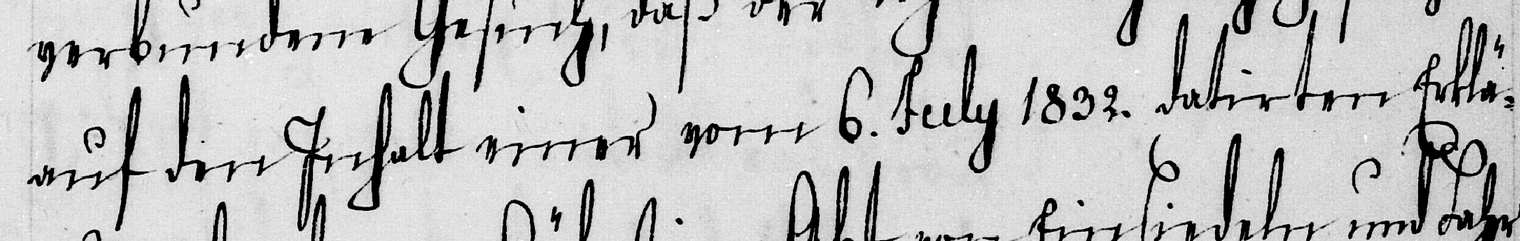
auf den Inhalt einer vom 6. July 1832. datirten Erklä¬
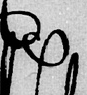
20.
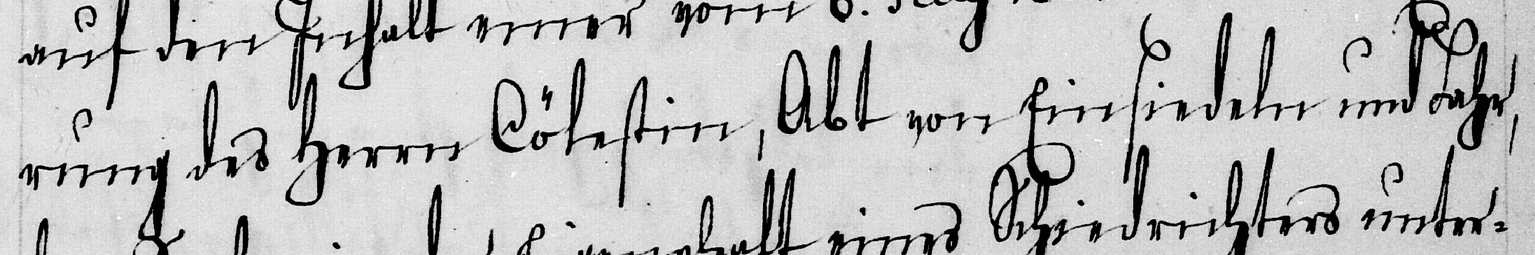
rung des Herrn Cölesti, Abt von Einsiedeln und Fahr,
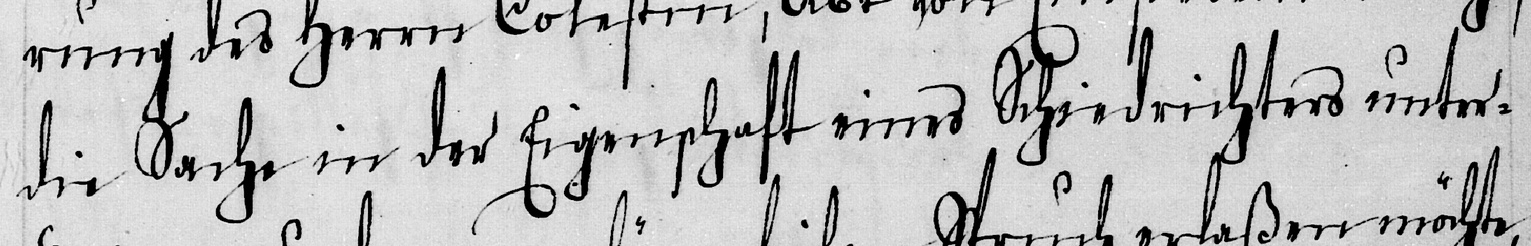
die Sache in der Eigenschaft eines Schiedsrichters unter¬
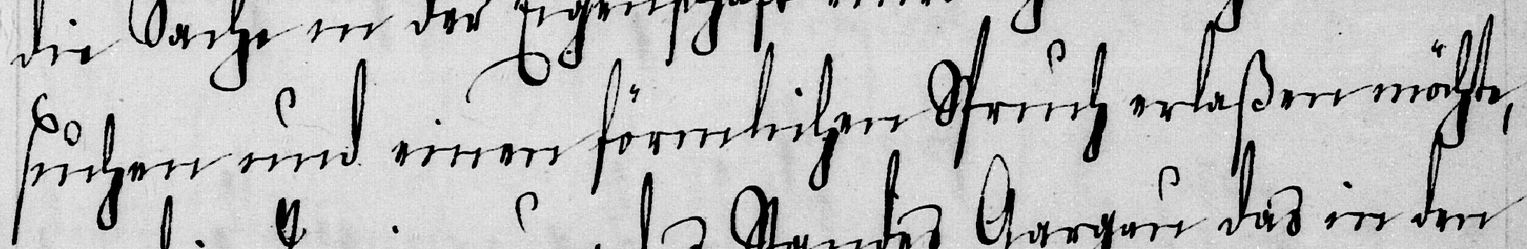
suchen und einen förmlichen Spruch erlaßen möchte,
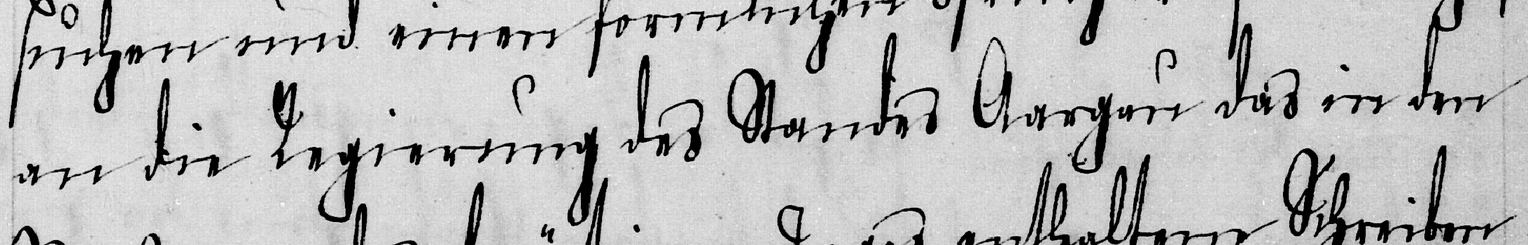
an die Regierung des Standes Aargau das in den
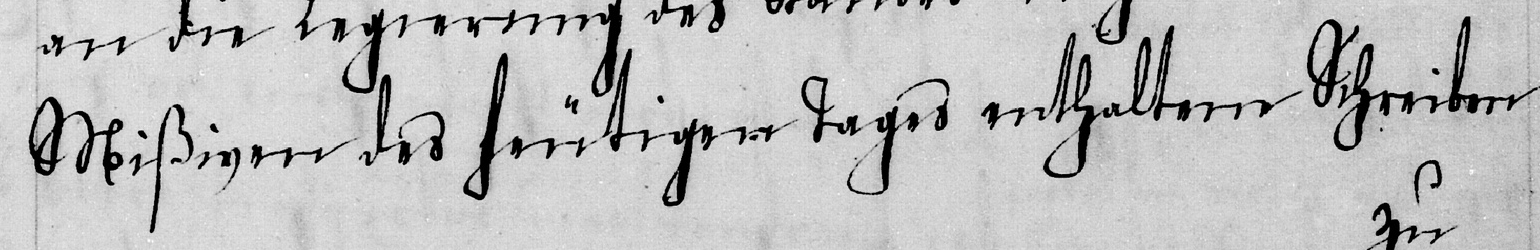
Mißiven des heutigen Tages enthaltene Schreiben
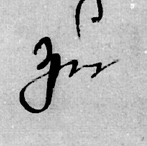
zu
